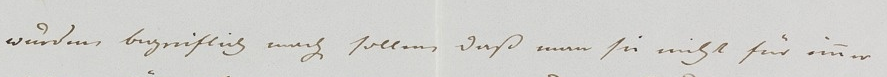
wurden, begreiflich machen sollen, daß man sie nicht für immer
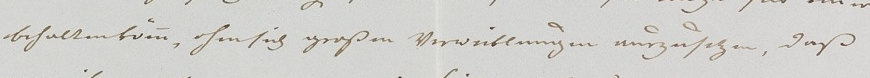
behalten könne, ohne sich großen Verwicklungen auszusetzen, daß
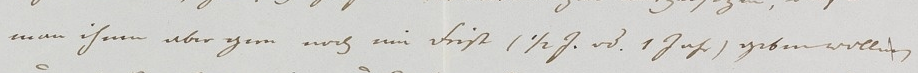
man ihnen aber gern noch eine Frist (½ J. od. 1 Jahr) geben wolle,
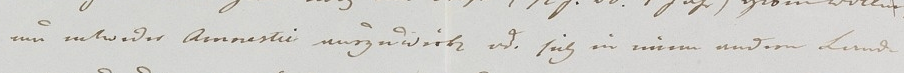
um entweder Amnestie auszuwirken od. sich in einem andern Lande
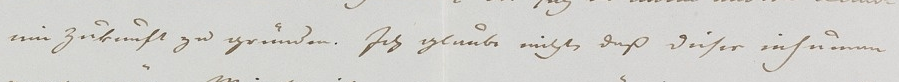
eine Zukunft zu gründen. Ich glaube nicht, daß dieses inhuman
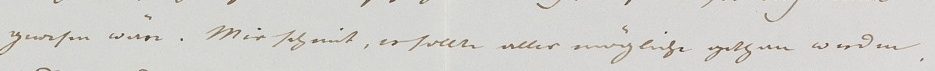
gewesen wäre. Mir scheint, es sollte alles mögliche gethan werden,
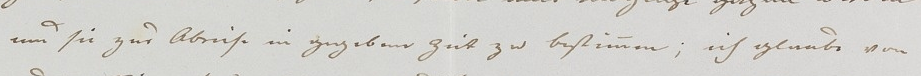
um sie zur Abreise in gegebner Zeit zu bestimmen; ich glaube von
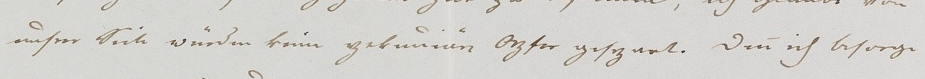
unsrer Seite würden keine pekuniären Opfer gespart. Denn ich besorge
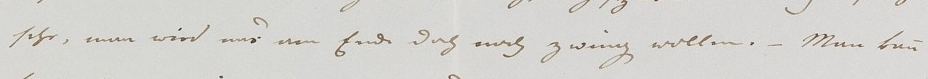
sehr, man wird uns am Ende doch noch zwingen wollen. – Man kann
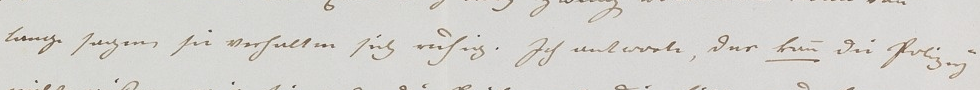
lange sagen, sie verhalten sich ruhig. Ich antworte, das kann die Polizey
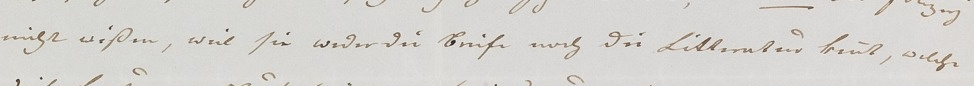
nicht wißen, weil sie weder die Briefe noch die Litteratur kennt, welche
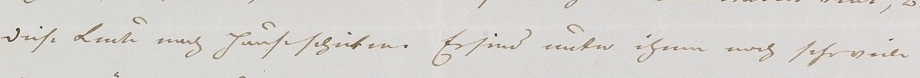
diese Leute nach Hause schicken. Es sind unter ihnen noch sehr viele
